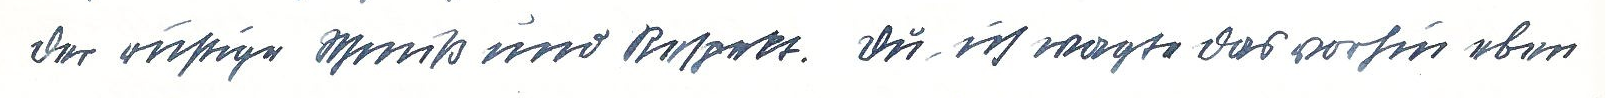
der richtige Schmiß und Respekt. Du, ich wagte das vorhin eben
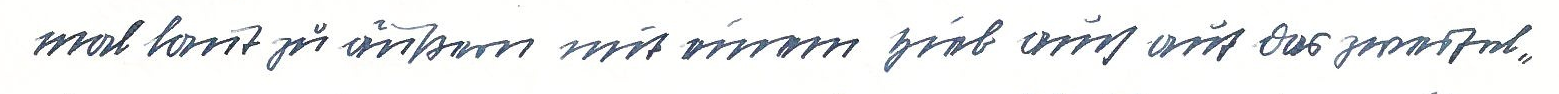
mal laut zu äußern mit einem Hieb auch auf das zweifel¬
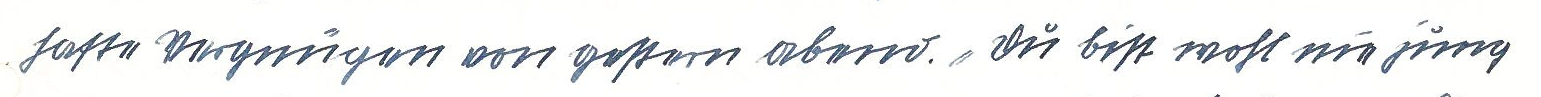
hafte Vergnügen von gestern abend. „ Du bist wohl nie jung
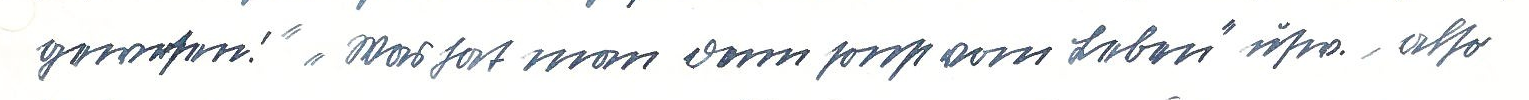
gewesen!“ „Was hat man denn sonst vom Leben“ usw., also
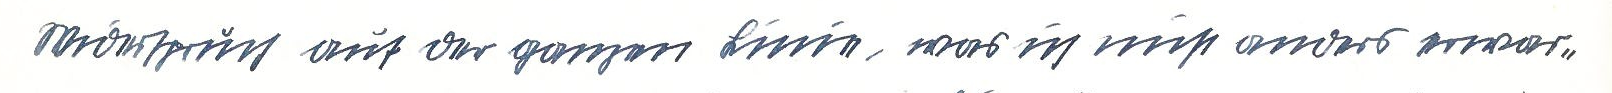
Widerspruch auf der ganzen Linie, was ich nicht anders erwar¬
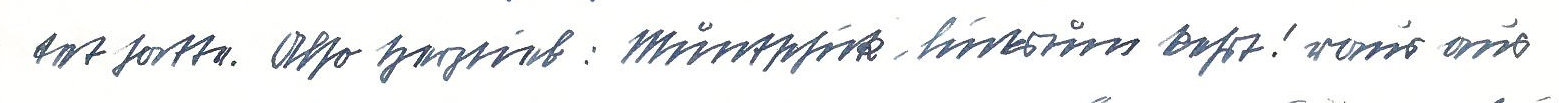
tet hatte. Also Herzlieb:, linksum kehrt! raus aus
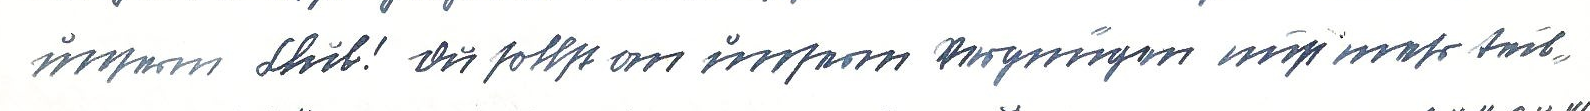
unserm Club! Du sollst an unserm Vergnügen nicht mehr teil¬
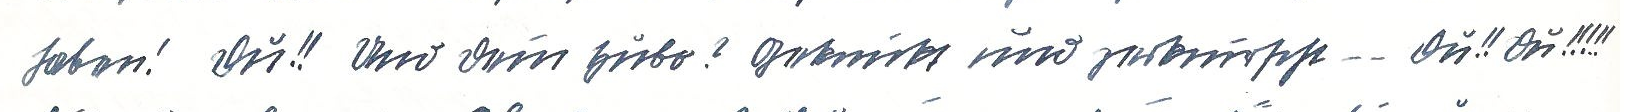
haben! Du!! Und Dein Hubo? Geknickt und zerknirscht – – Du!! Du!!!!!
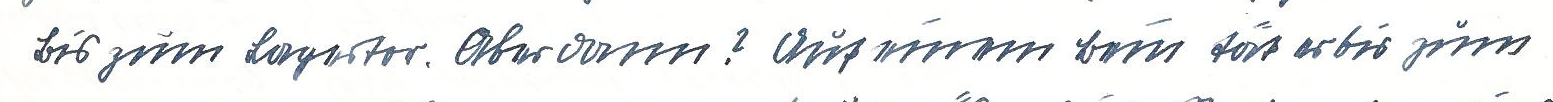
Bis zum Lagertor. Aber dann? Auf einem Bein tät er bis zum
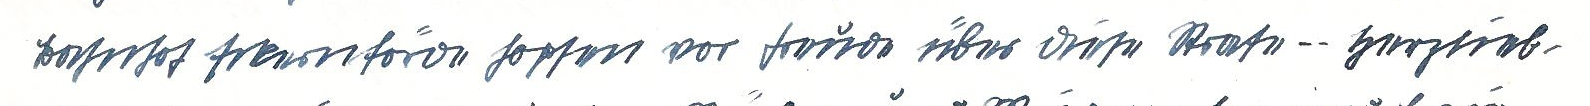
Bahnhof E. hopsen vor Freude über diese Strafe – – Herzlieb,
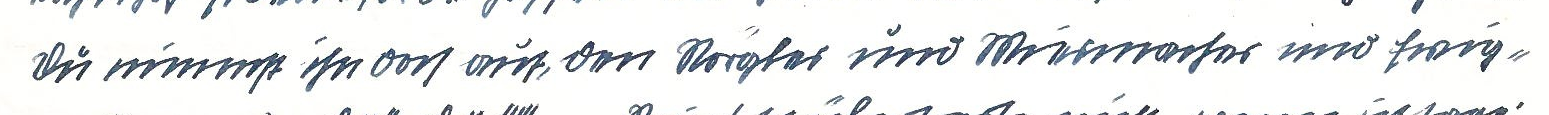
Du nimmst ihn doch auf, den Nörgler und Miesmacher und Ewig¬
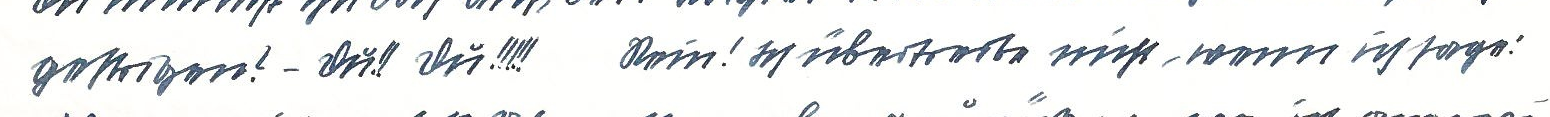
gestrigen? – Du!! Du!!!!! Nein! Ich übertreibe nicht, wenn ich sage:
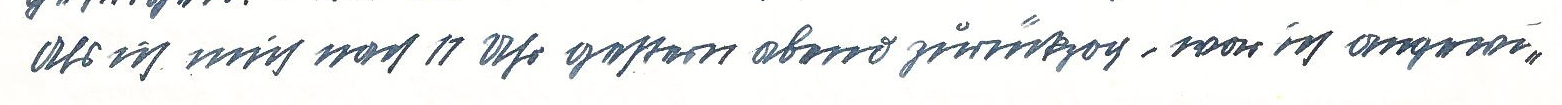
Als ich mich nach 11 Uhr gestern abend zurückzog, war ich angewi¬
